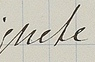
Weise
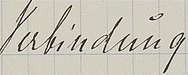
Verbindung
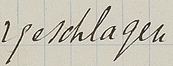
gestern telegr.
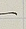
gemeldet,
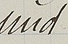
bereit
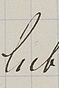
mir
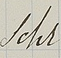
früher
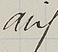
Ich
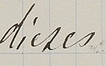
heute
